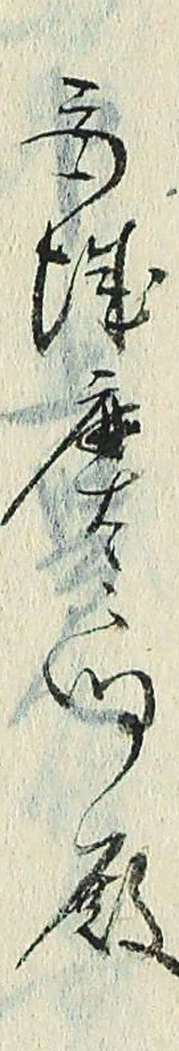宮城麻太郎殿
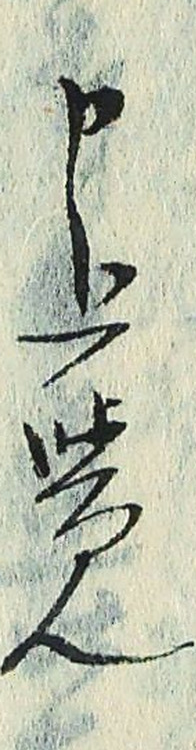申上覚
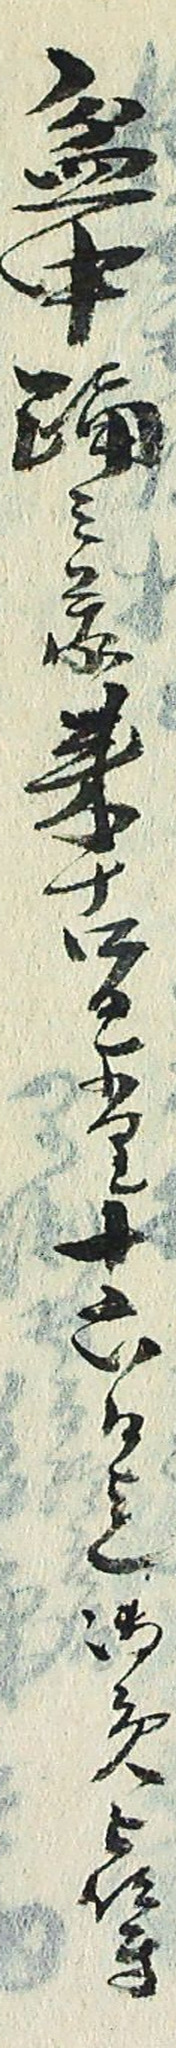盆中踊之義来る十四より十六日迄御免被仰付
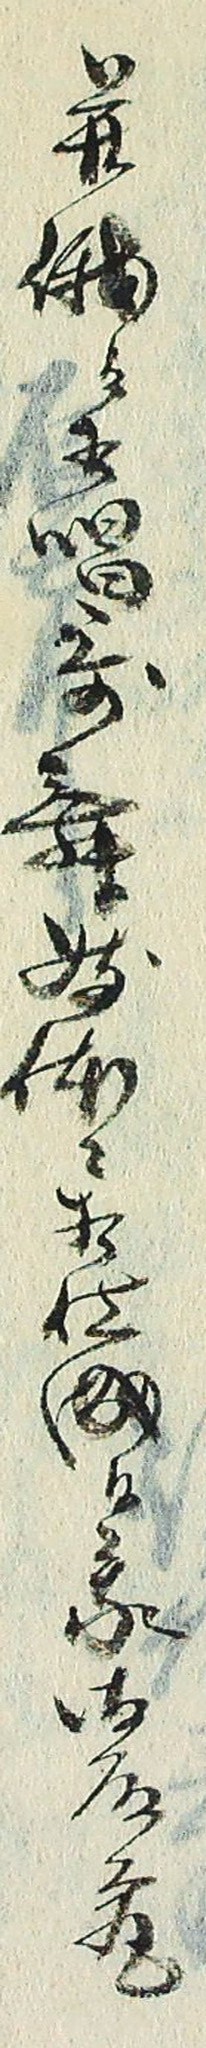幷俄と相唱哥舞妓体に相仕成候義御取究
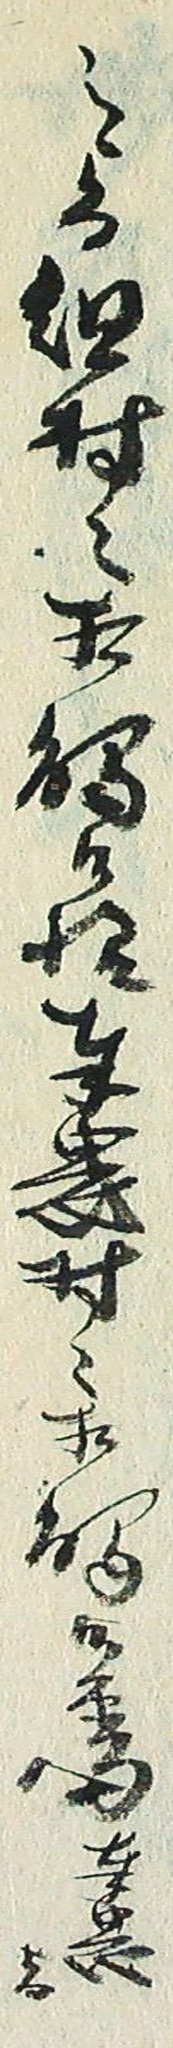之旨組村々相触候様奉畏村々相触候処奉畏旨
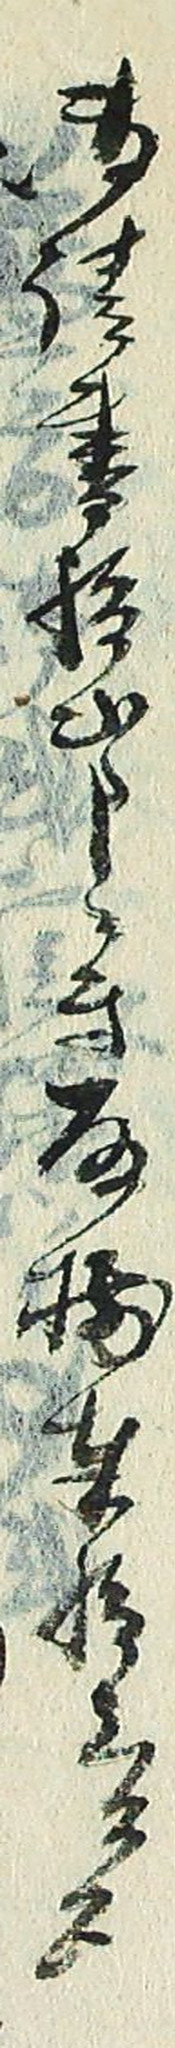御請書指出申に付取揃奉指上候以上
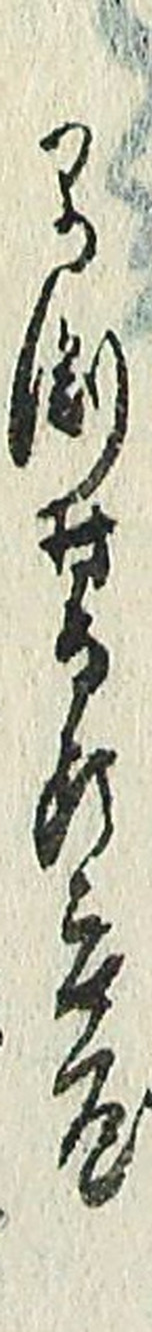早淵村与頭庄屋
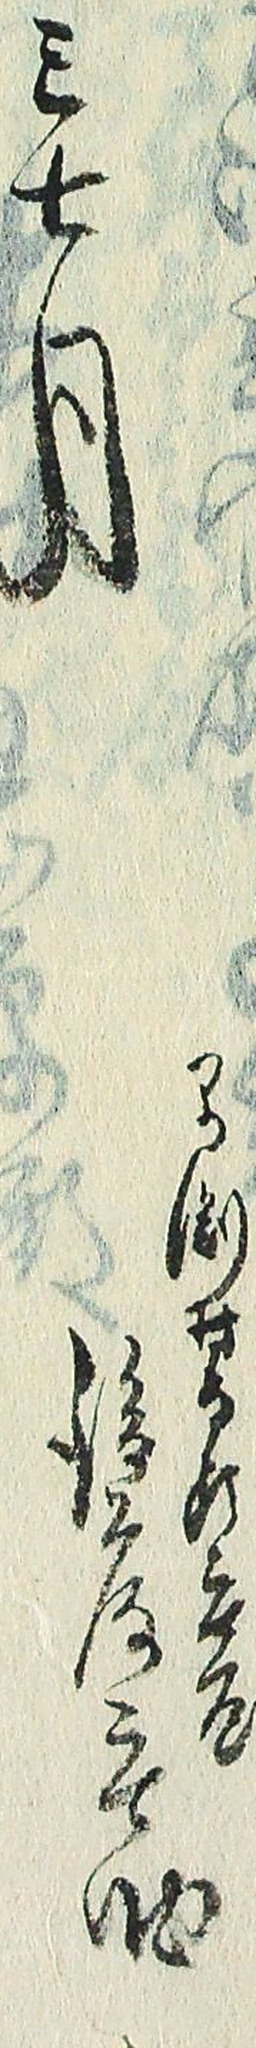巳七月後藤庄助
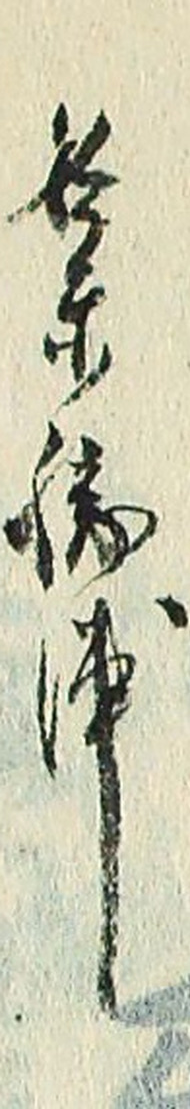名東勝浦
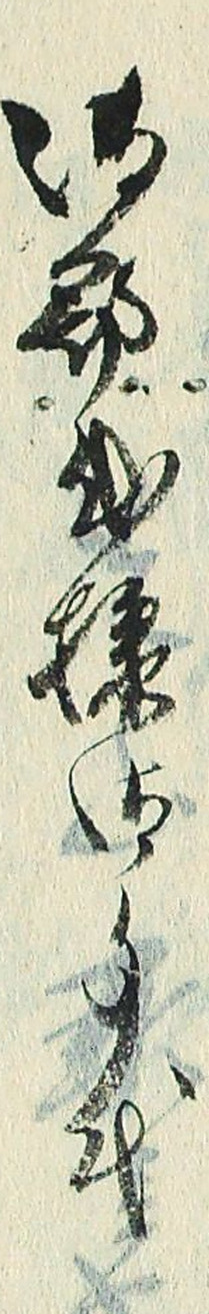御郡代様御手代

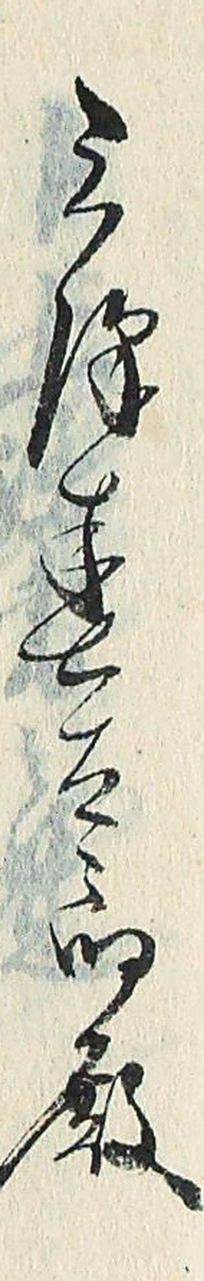三沢春太郎殿
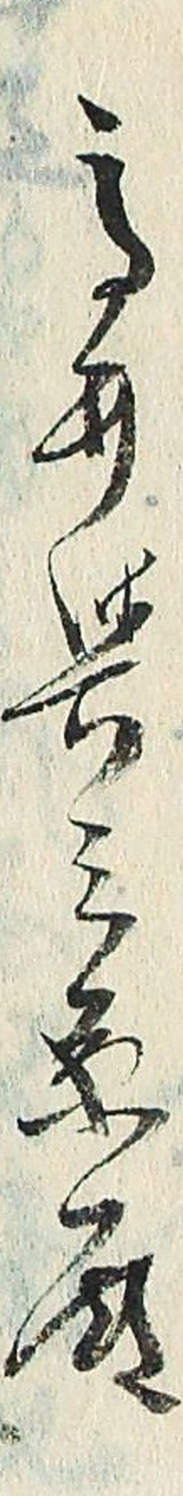高井与三兵衛殿
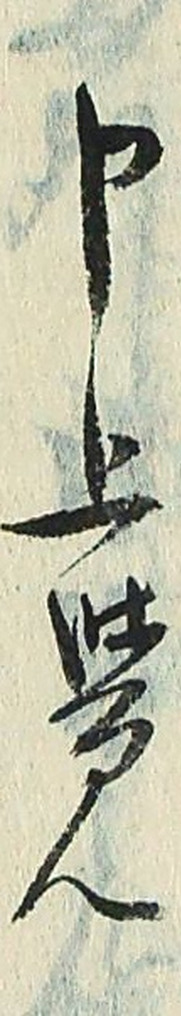申上覚
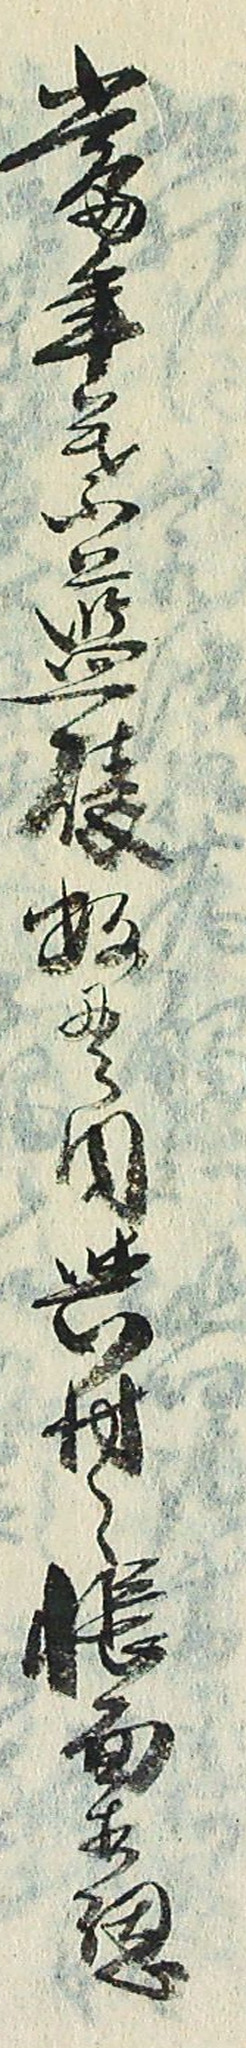当年葉藍俵数貫目与村々帳面相認
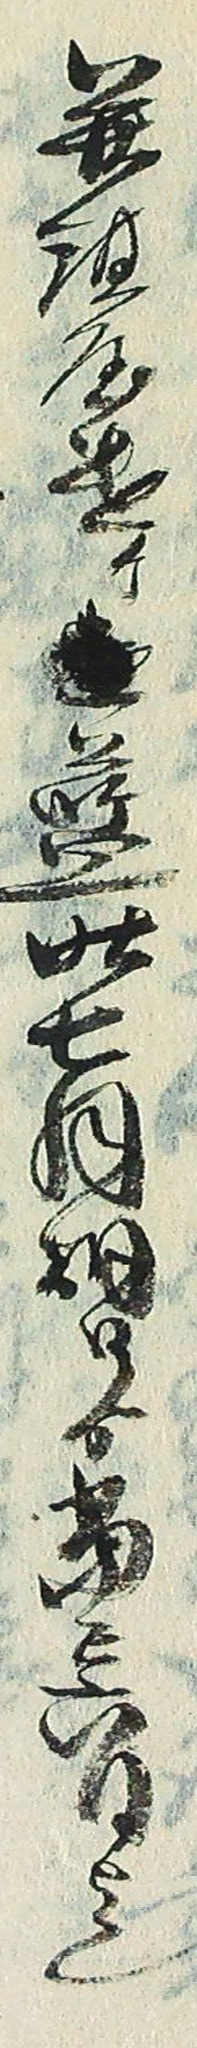幷紺屋遣け藍昨七月朔日ゟ当巳六月迄
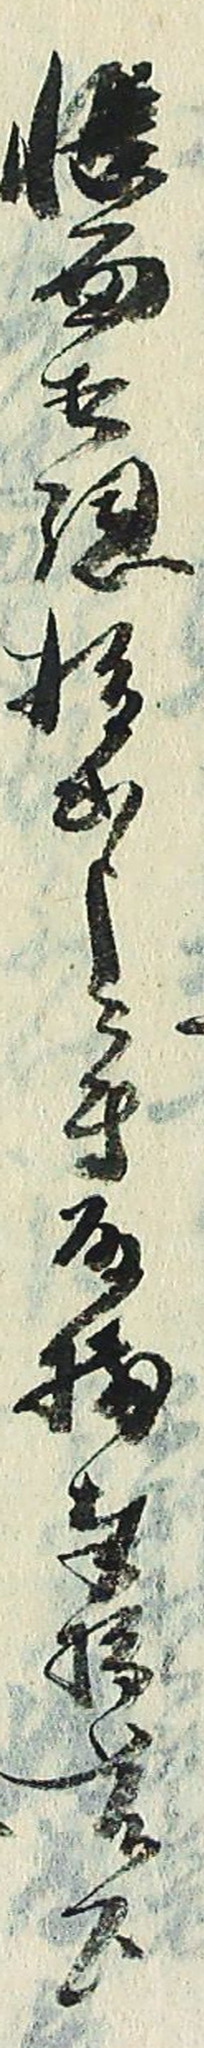帳面相認指出申に付取揃奉指上候以上
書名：諸御用御□受書控
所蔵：鳴門教育大学 Naruto University of Education
